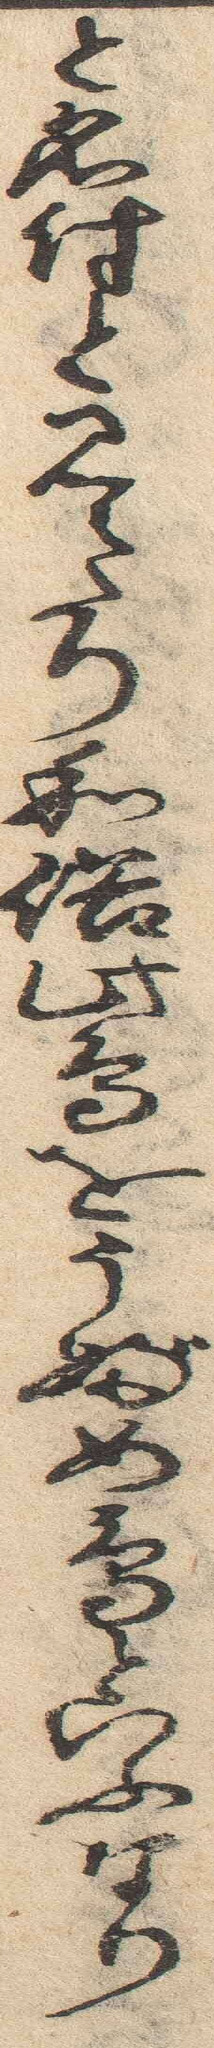と名付と見えたり和俗此鳥をうぶめ鳥といふなり
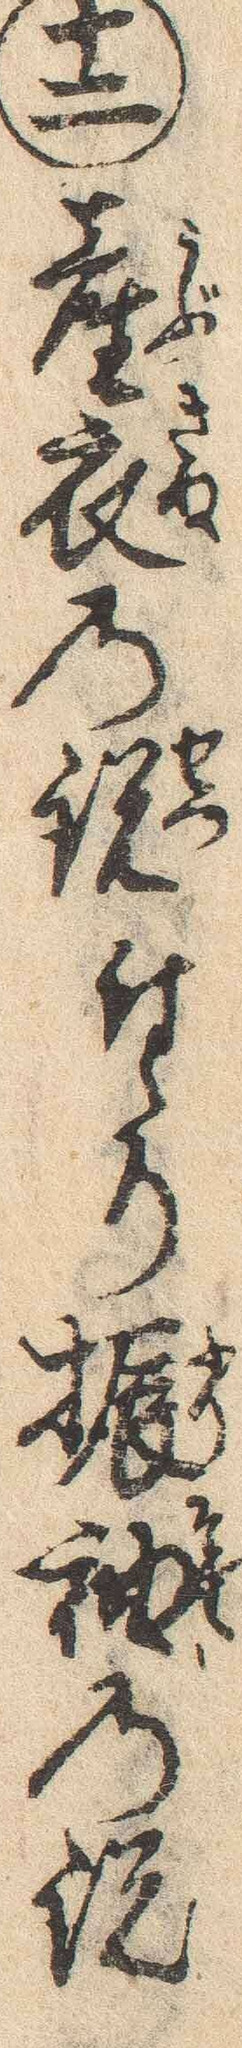十二産衣の説付たり振袖の説
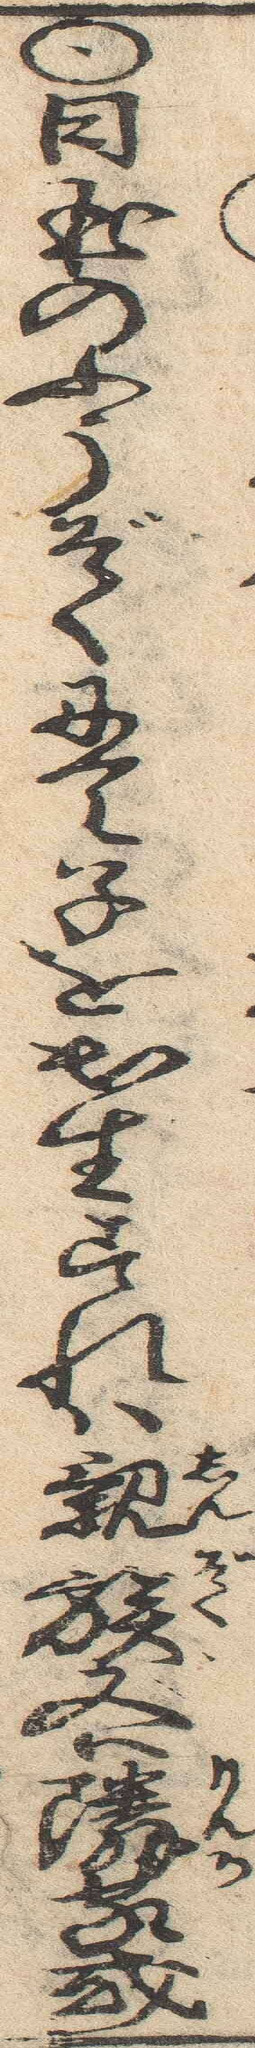◯日本のふうぞくにて子を出生すれは親族又は隣家或
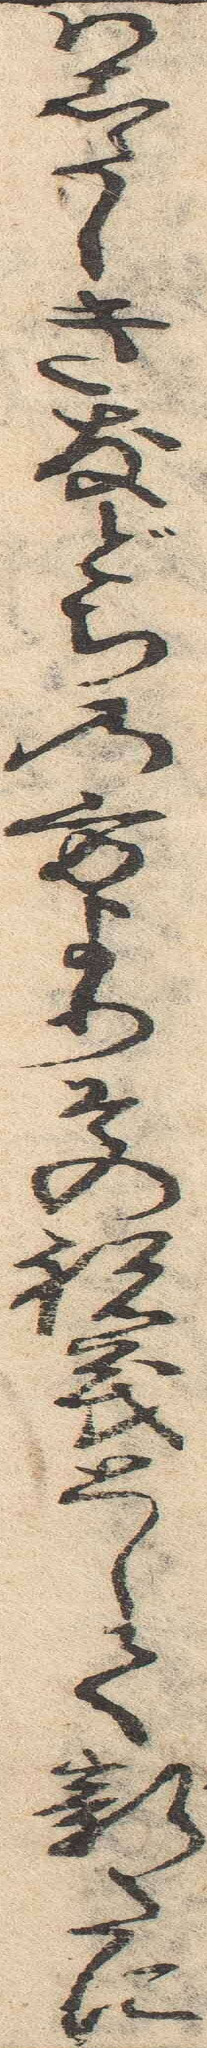はしたしき友どちの方よりその祝義として新たに
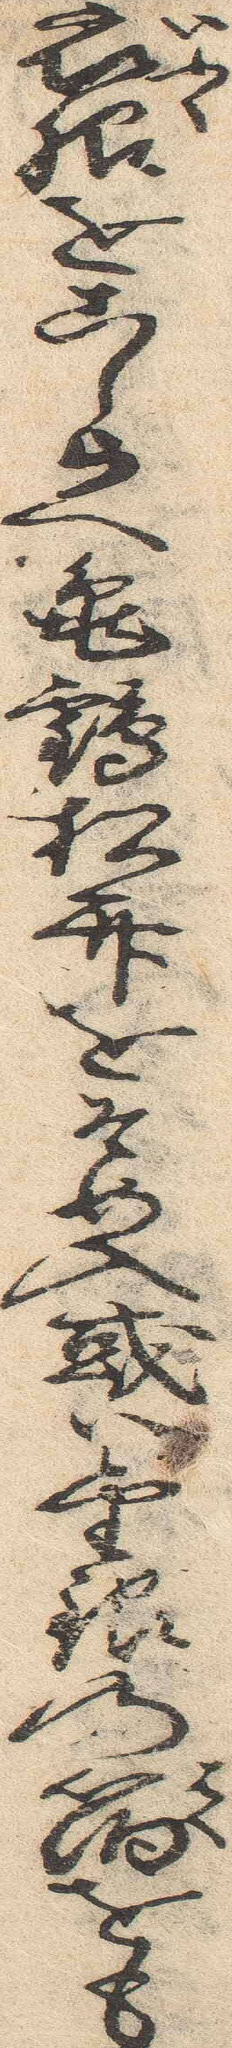衣服をこしらへ亀鶴松竹をそめ入或は金銀の箔をも
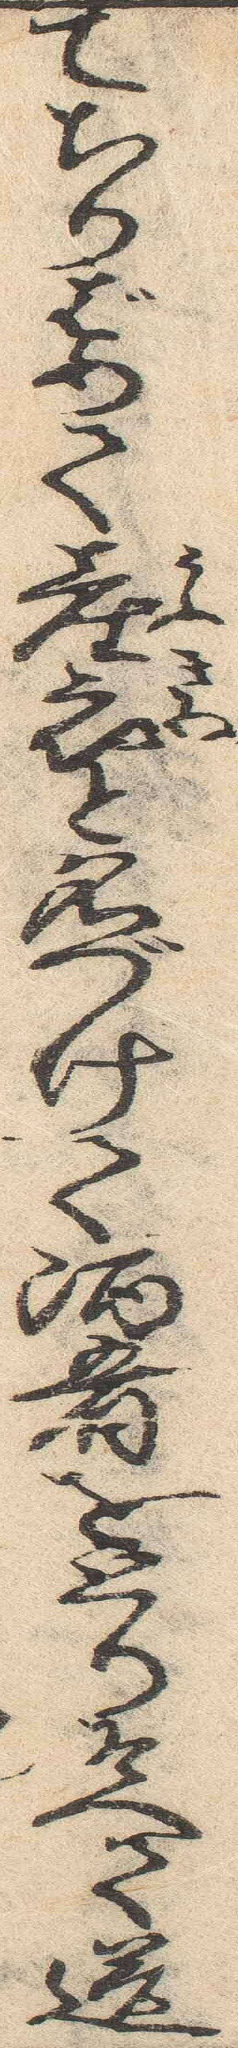てちりばめて産衣と名づけて酒肴をとりそへて送
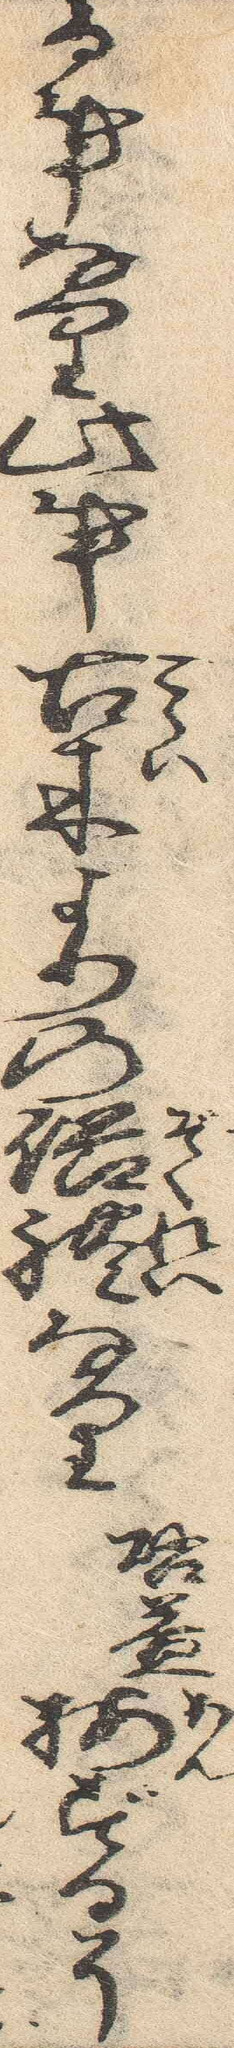る事なり此事古来よりの俗禮なり啓益按ずるに
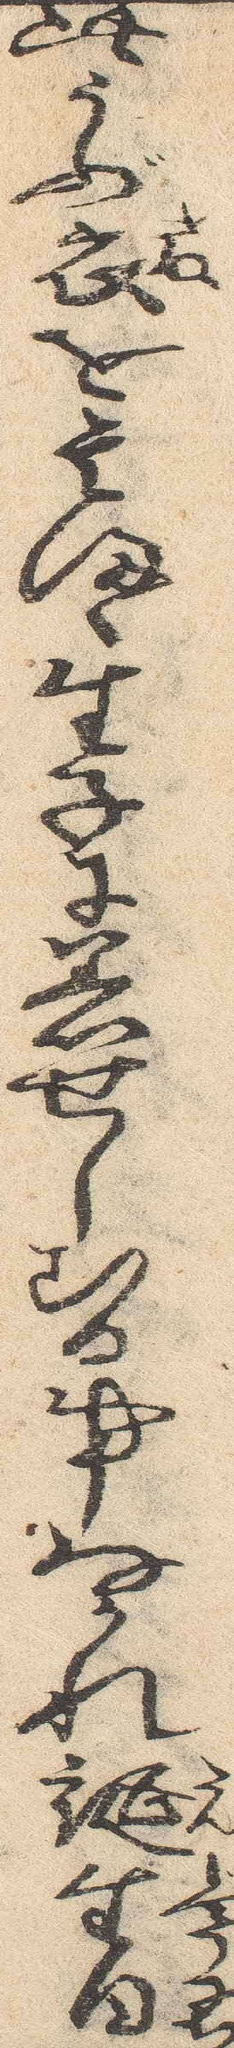此うぶ衣を其まゝ生子に着せしむる事なかれ誕生日
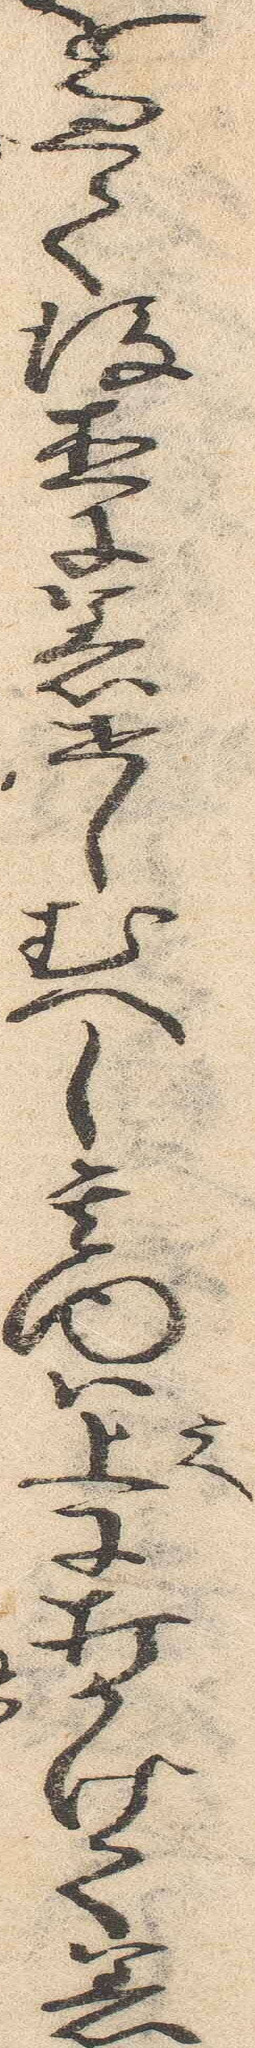を過て後直に着せしむへし其内は上に打かけて着
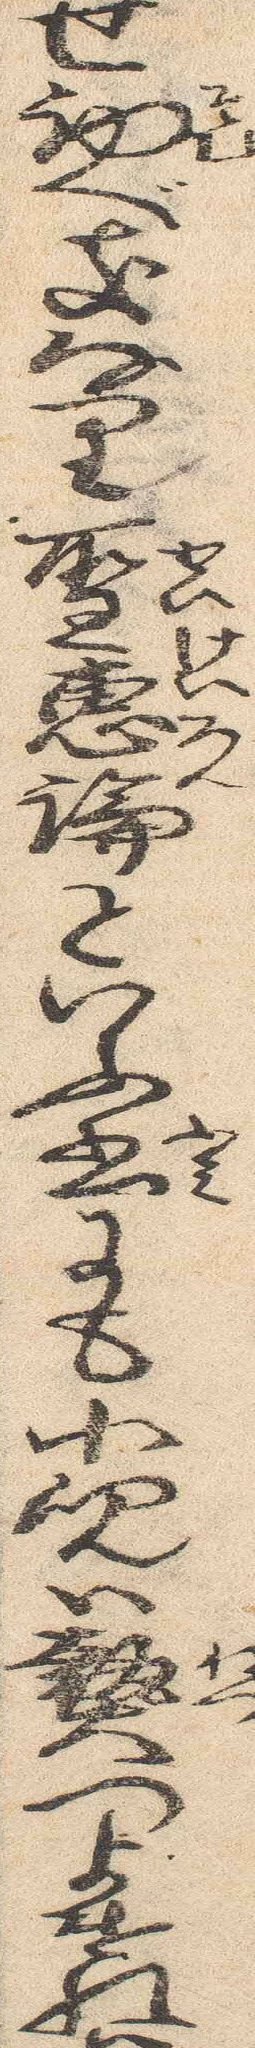せ初べきなり聖恵論といふ書にも小児は𤍽つよけれは
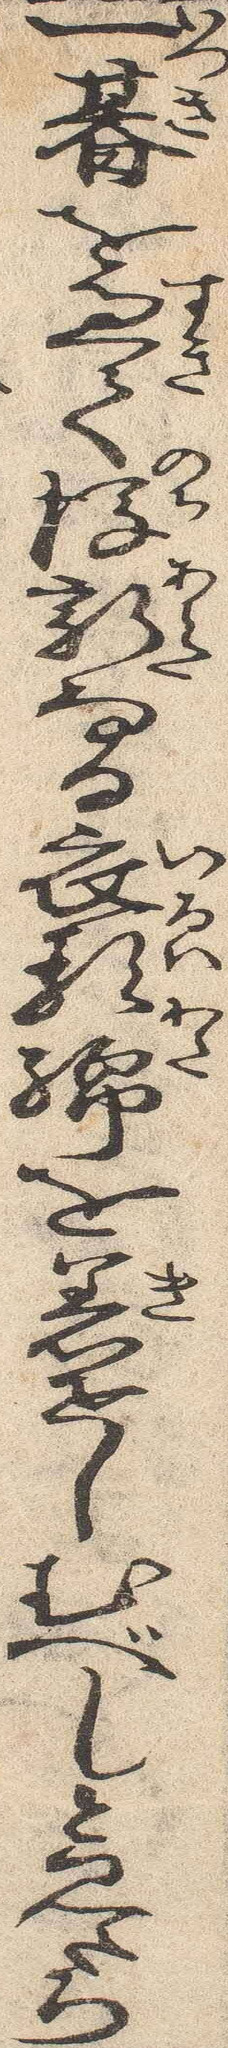一朞を過て後新なる衣類綿を着せしむべしと見えたり
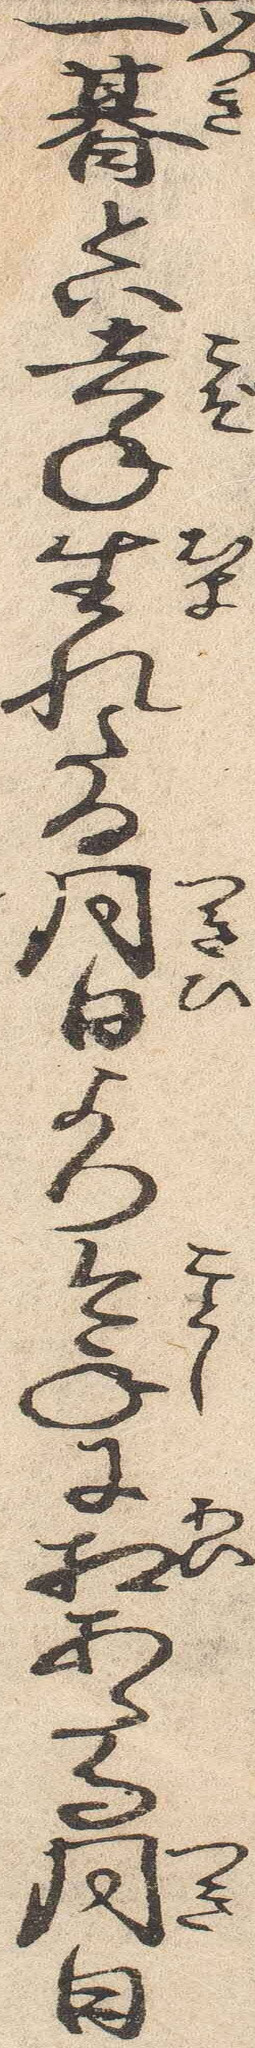一朞とは去年生れたる月日より今年に相あたる月日
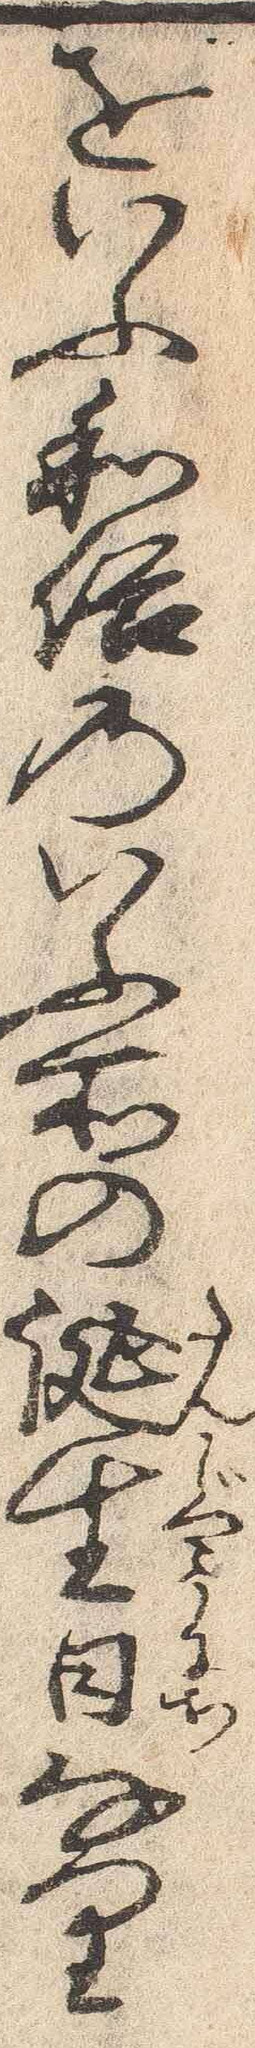をいふ和俗のいふ所の誕生日なり
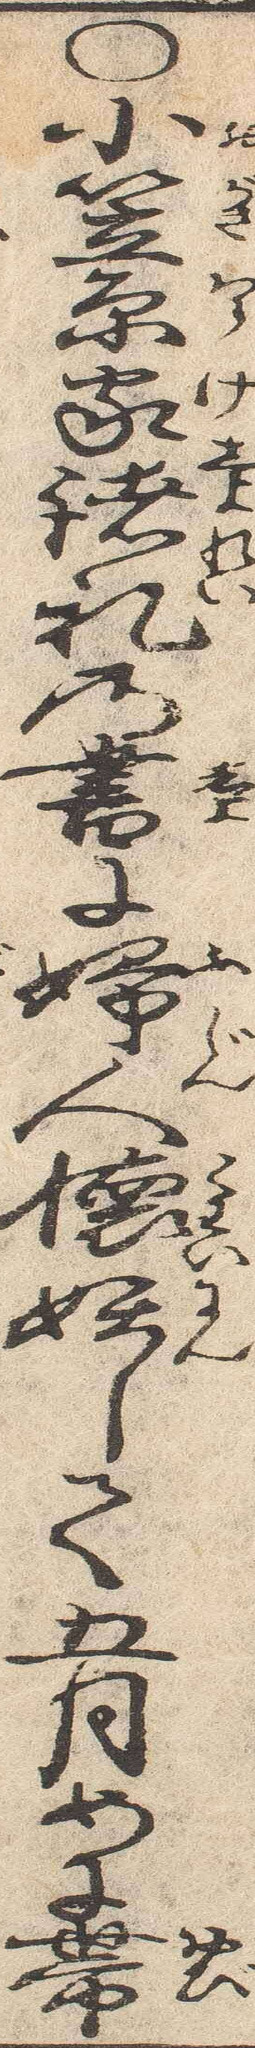◯小笠原家諸礼の書に婦人懐妊して五月めに帯
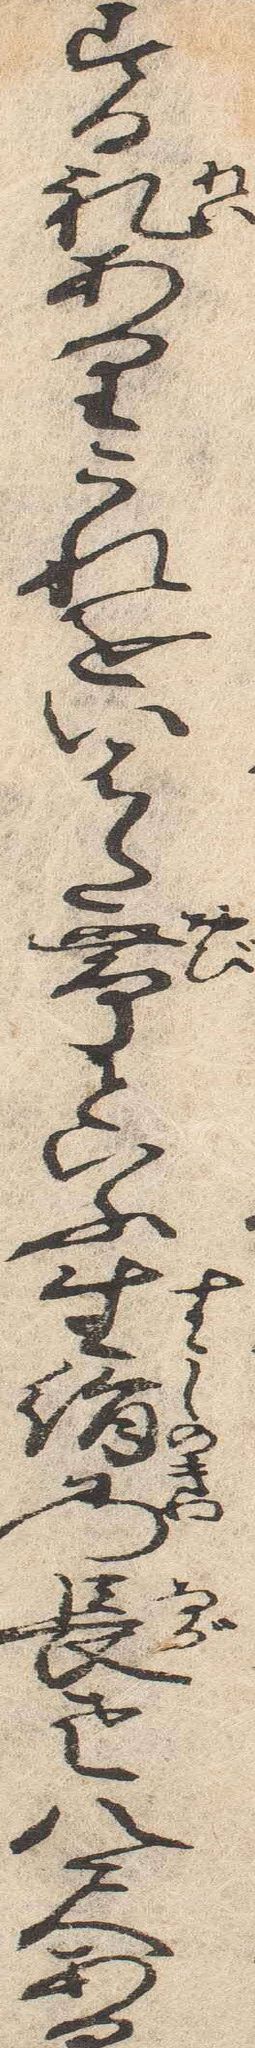する礼ありこれをいはた帯といふ生絹の長さ八尺ある
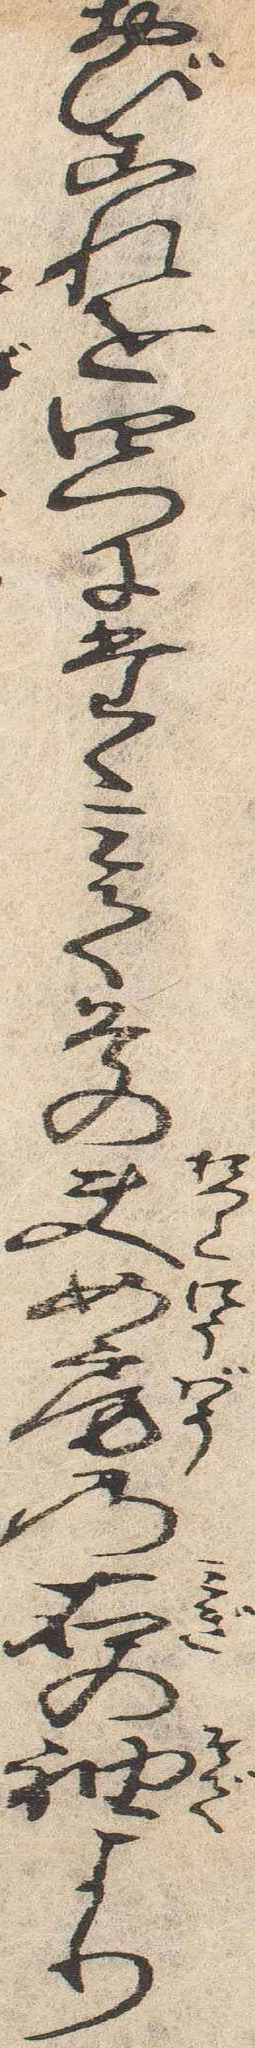おびこれを四つにたゝみてその夫女房の右の袖より
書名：小児必用養育草
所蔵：東京学芸大学附属図書館 国文学研究資料館
